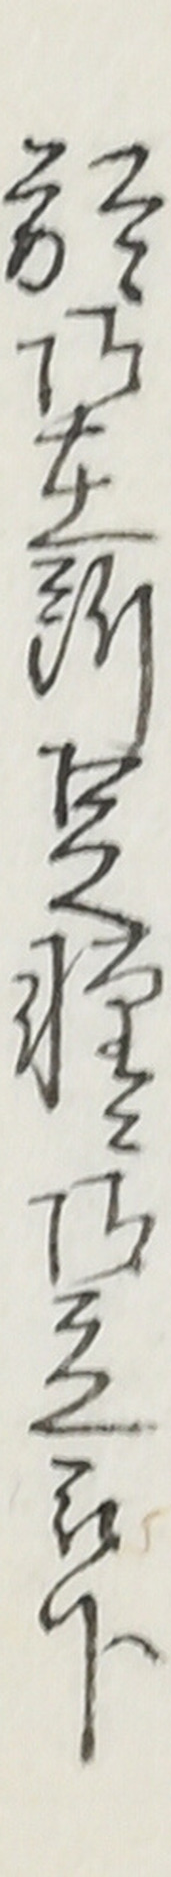於御在所足軽ニ御立被下
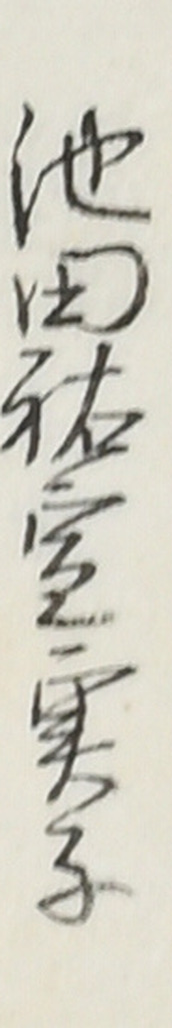池田祐宣実子
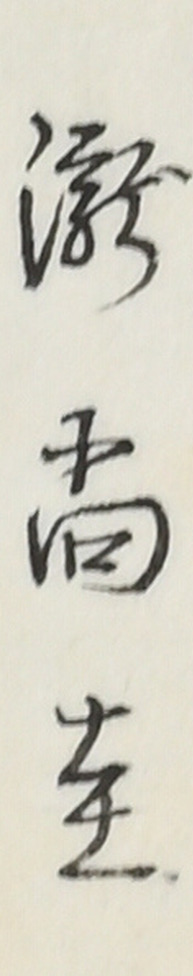瀧尚圭
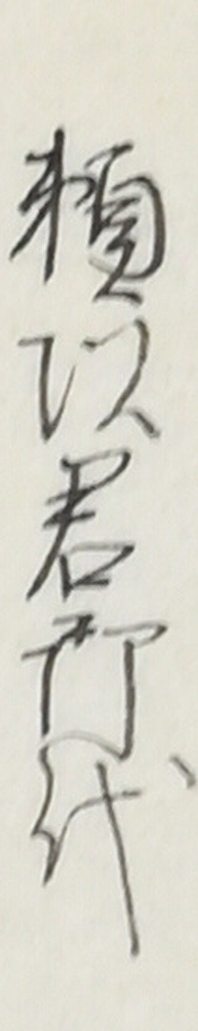頼以君御代
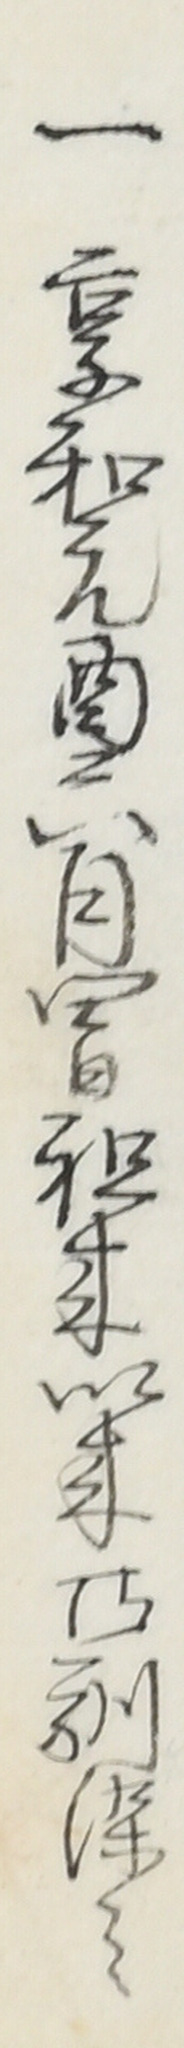一享和元酉六月四日祖来以来御馴染之

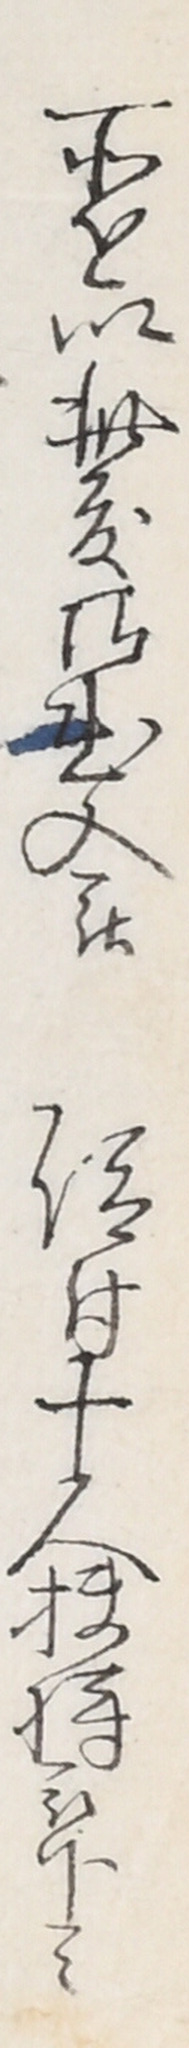所を以此度御出入被仰付十人扶持被下之
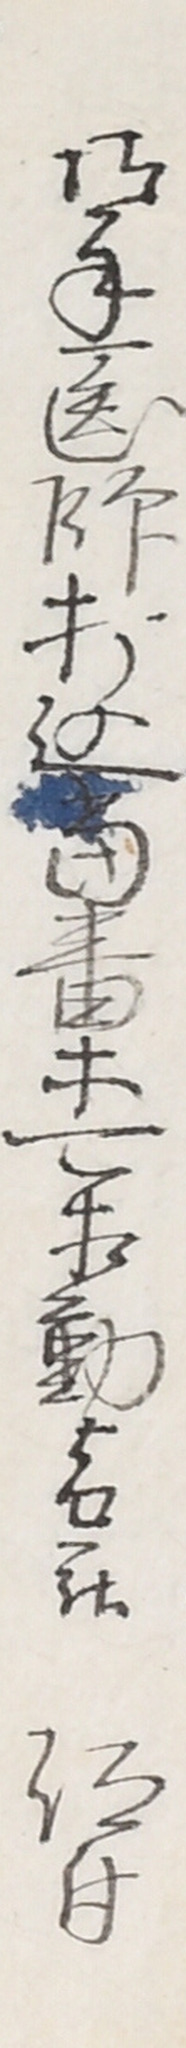御手医師打込当番等可相勤旨被仰付
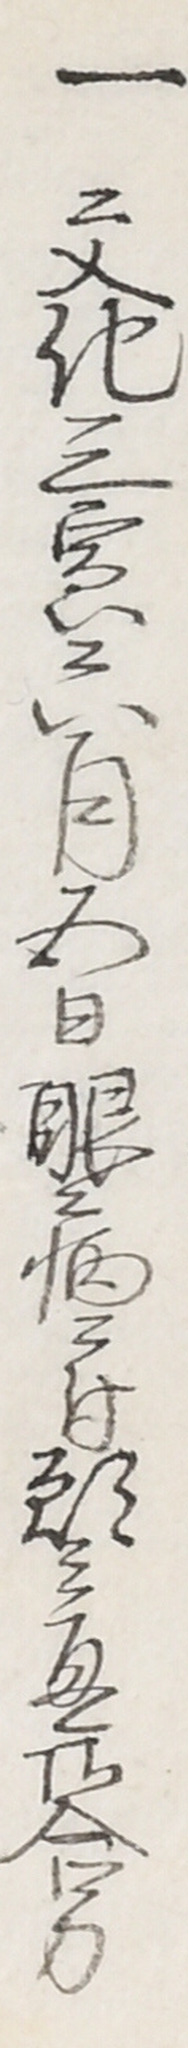一文化三寅六月五日眼病ニ付願之通御合力
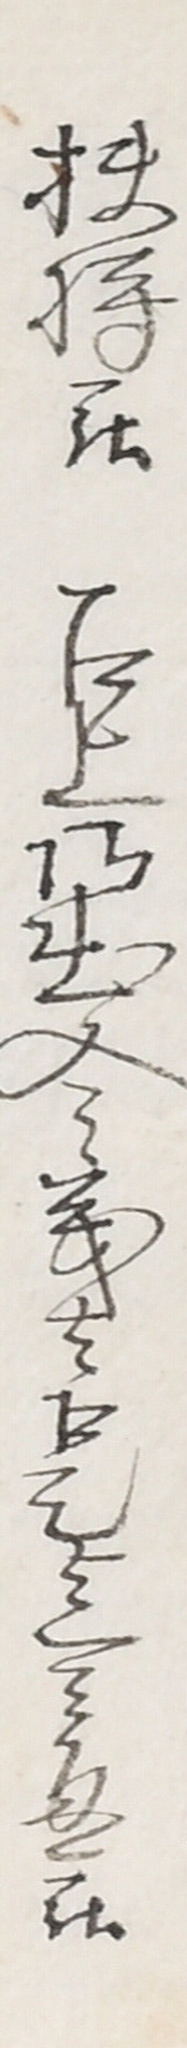扶持被召上御出入之義は是迄之通被
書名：給人諸士勤仕録（七）
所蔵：伊那市立高遠町図書館・合同会社AMANE
